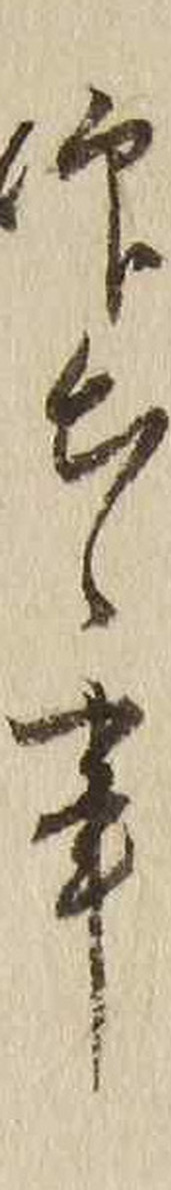仰出候事
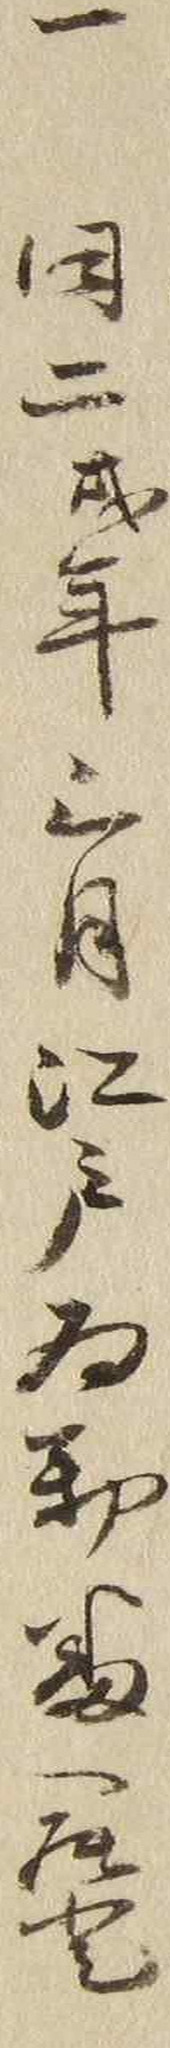一同二戌年三月江戸為勤番罷登
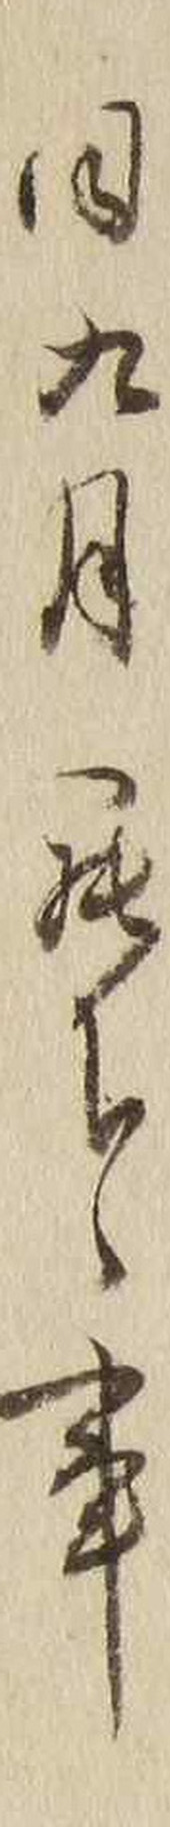同九月罷下候事
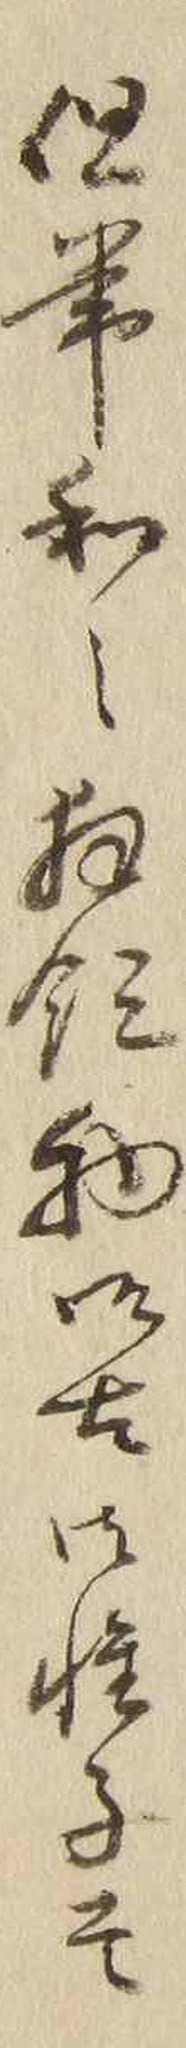但常和之拝領物御古御帷子壱

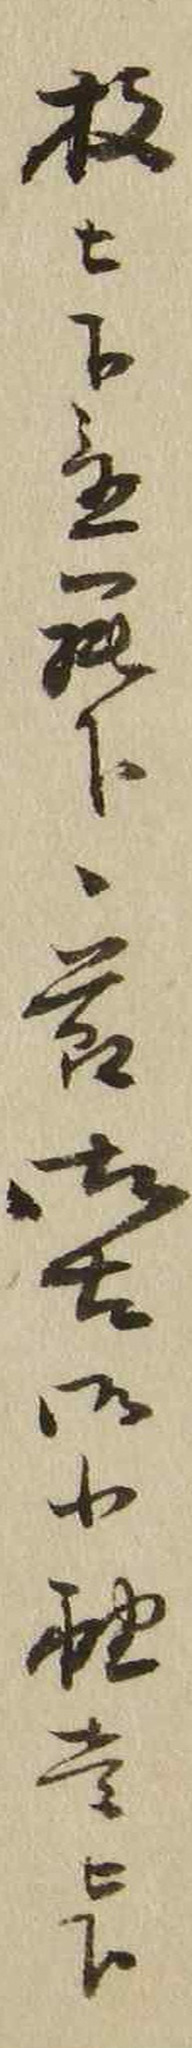枚被下置罷下候節御古御小袖壱被下
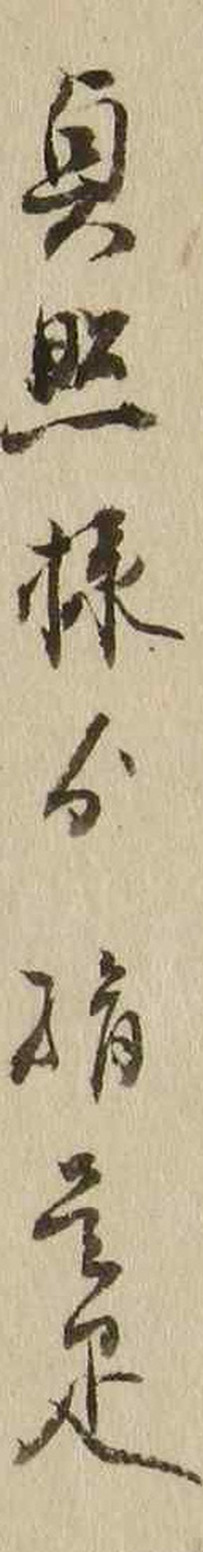貞照様ゟ絹壱疋
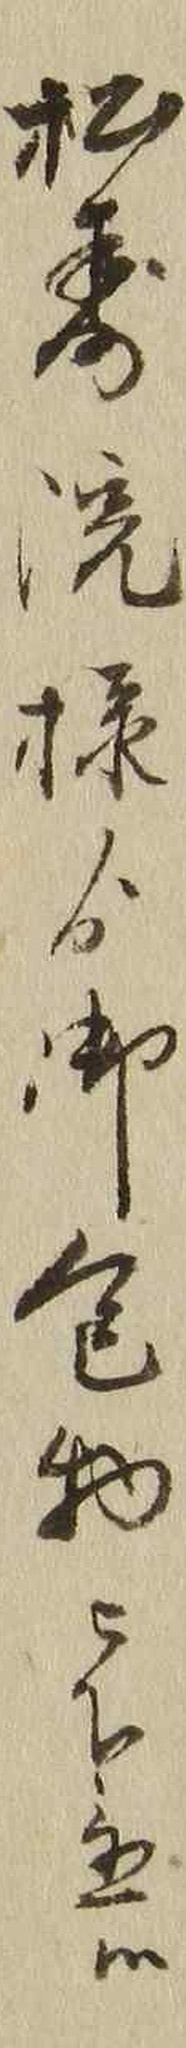松寿院様ゟ御包物被下置候
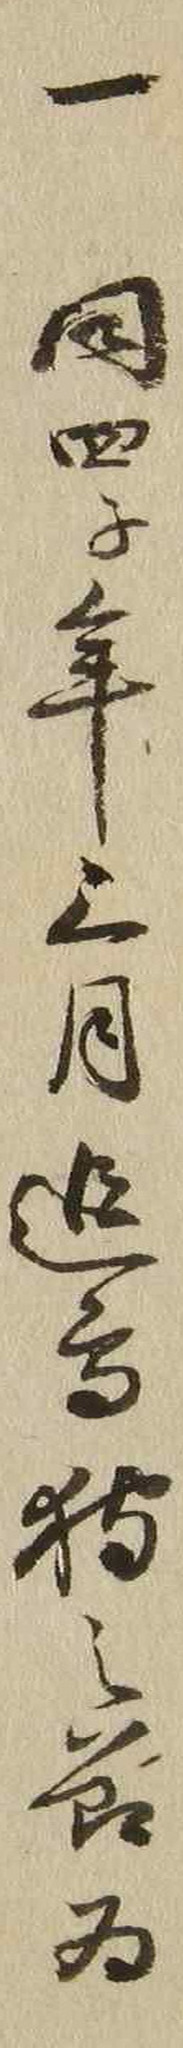一同四子年三月追鳥狩之節為
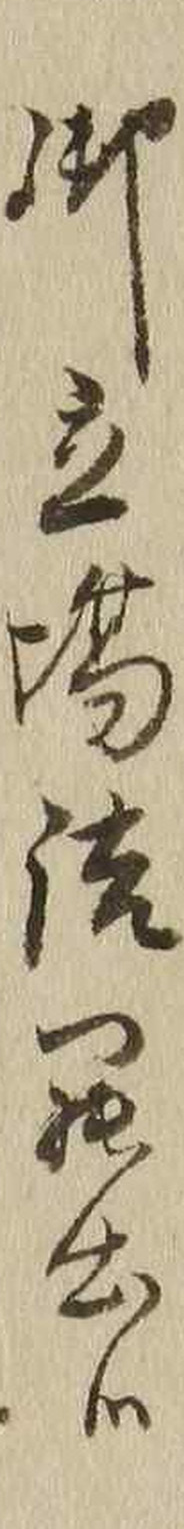御立場詰罷出候
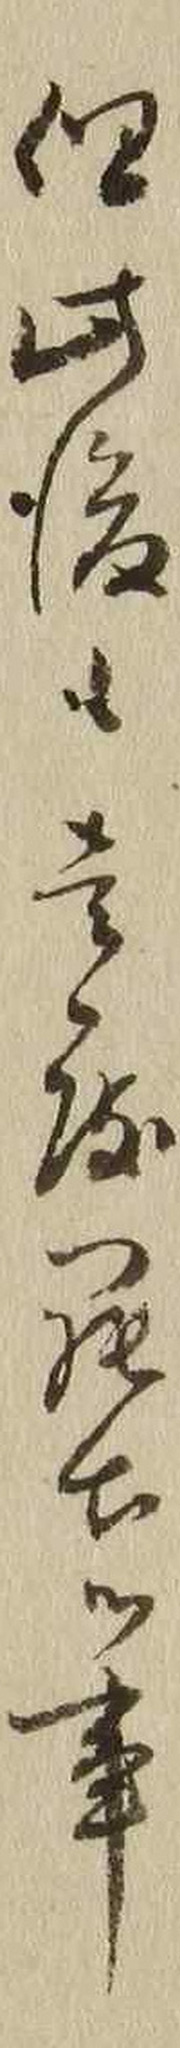但此後も壱度罷出候事
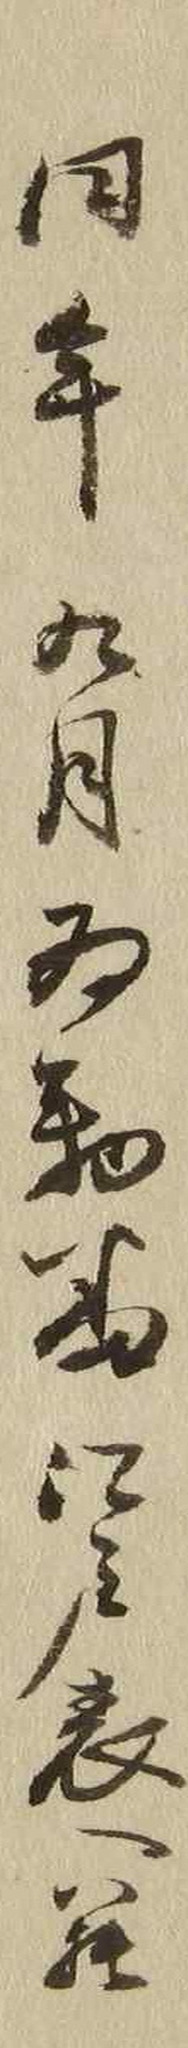一同年九月為勤番江戸表へ罷
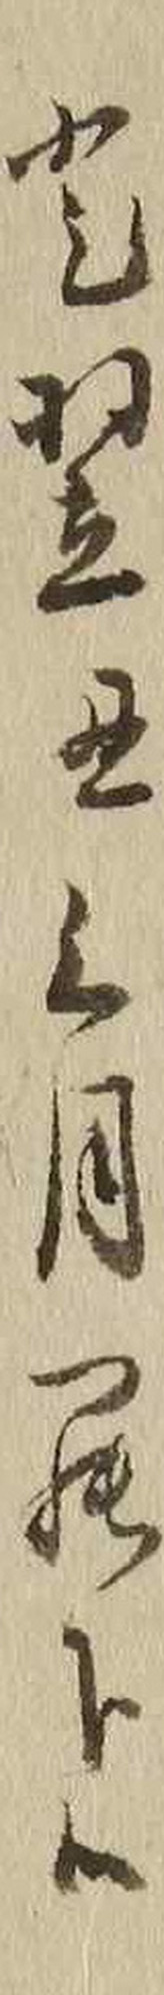登翌丑三月罷下候
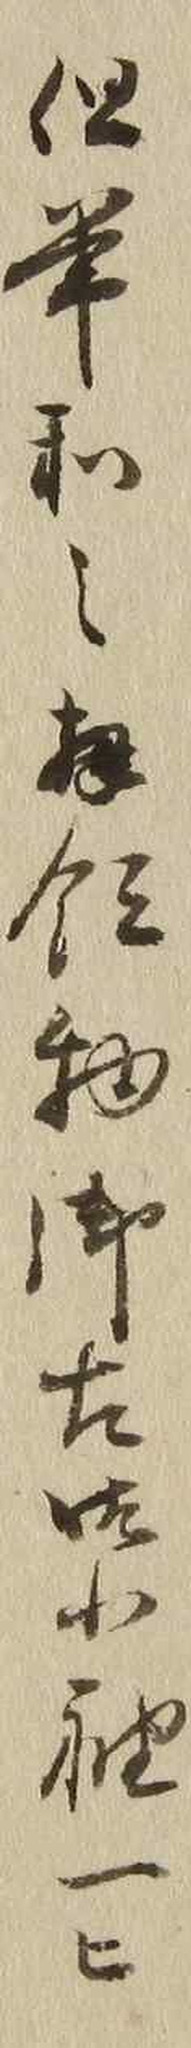但常和之拝領物御古御小袖一被
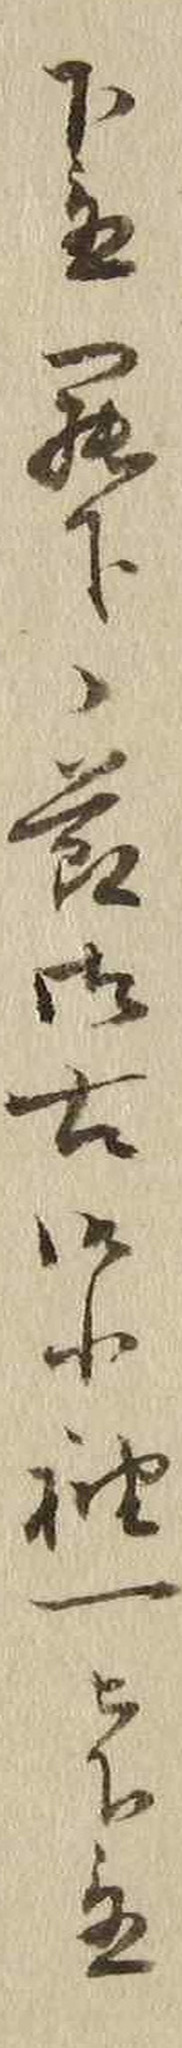下置罷下候節御古御小袖一被下置
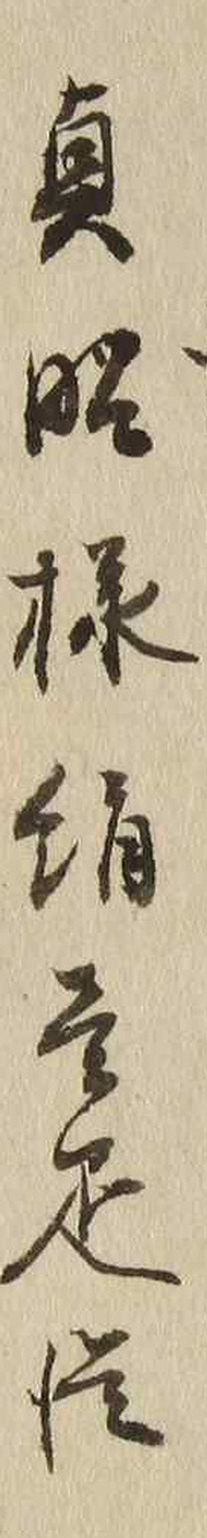貞昭様絹壱疋従
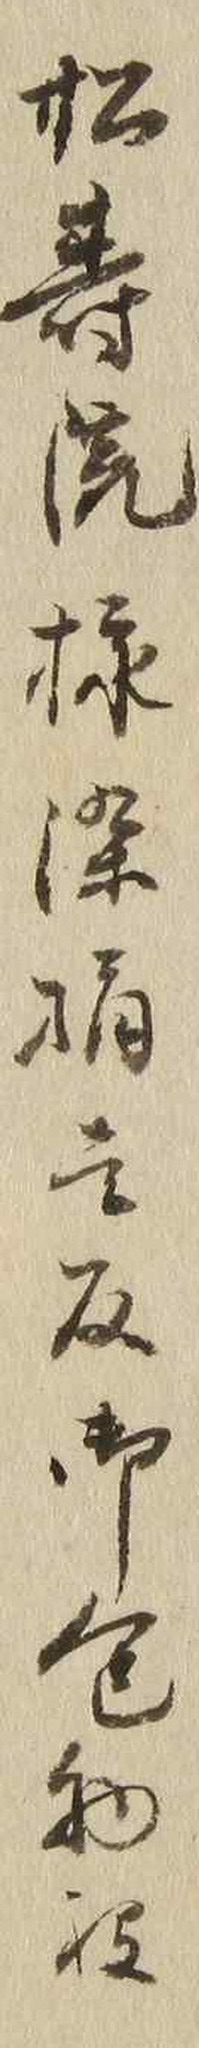松寿院様染絹壱反御包物被
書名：諸士系譜　巻之225　ま之部6
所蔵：会津若松市立会津図書館
